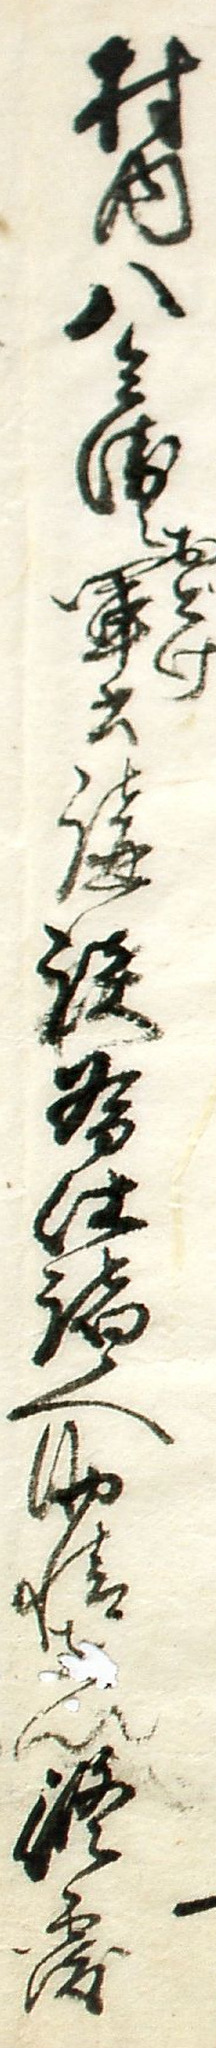村内八兵衛ニおどけ軍書講談為仕諸人助情を以修覆
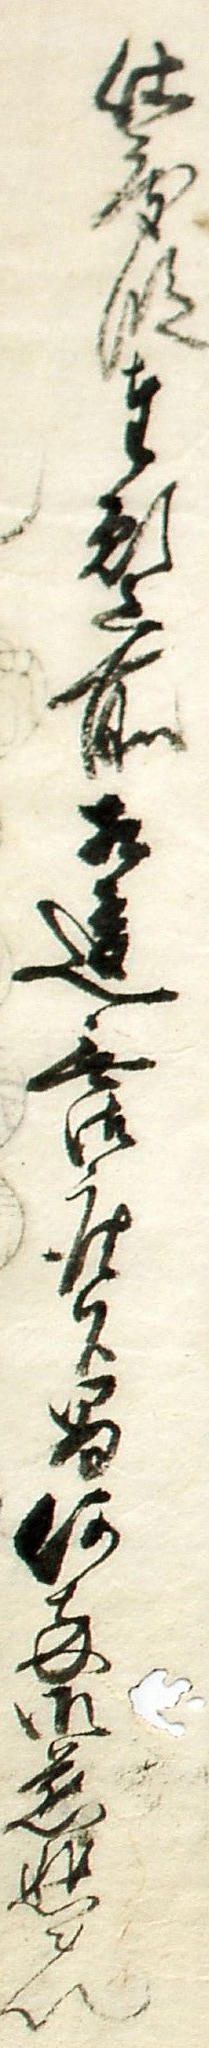仕度段奉願上所相違無御座候間何卒御慈悲ヲ以
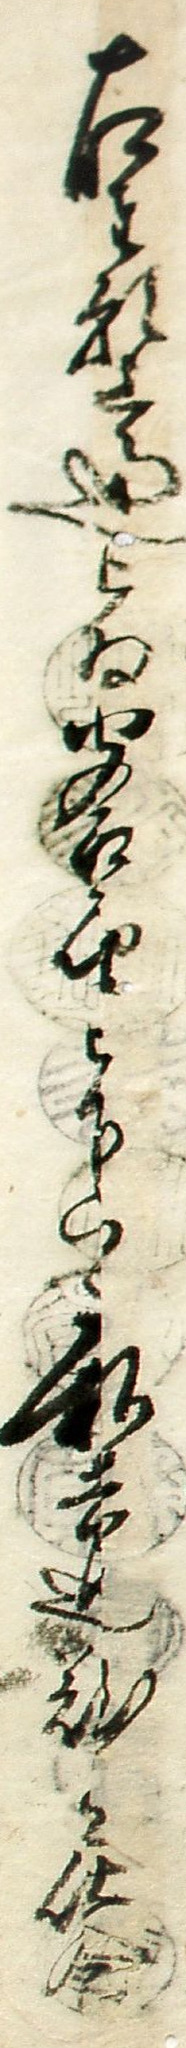右奉願上通被為聞召届被下候ハヽ私共迄難有仕合
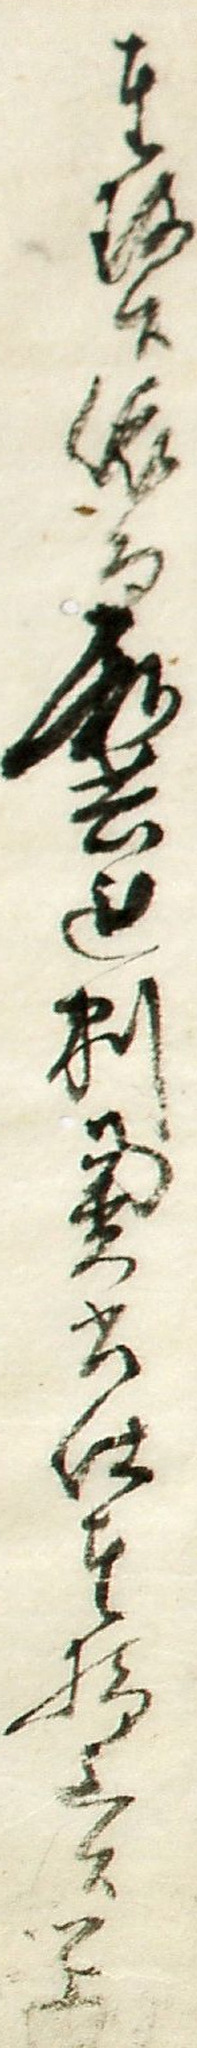奉存候依而私共連判奥書仕奉指上候以上
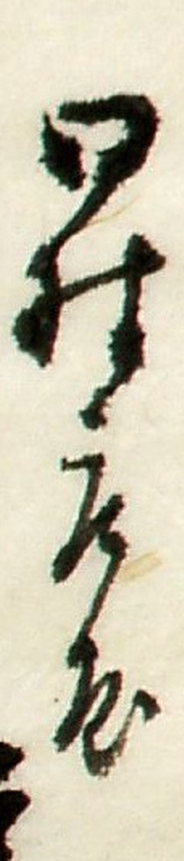同村庄屋
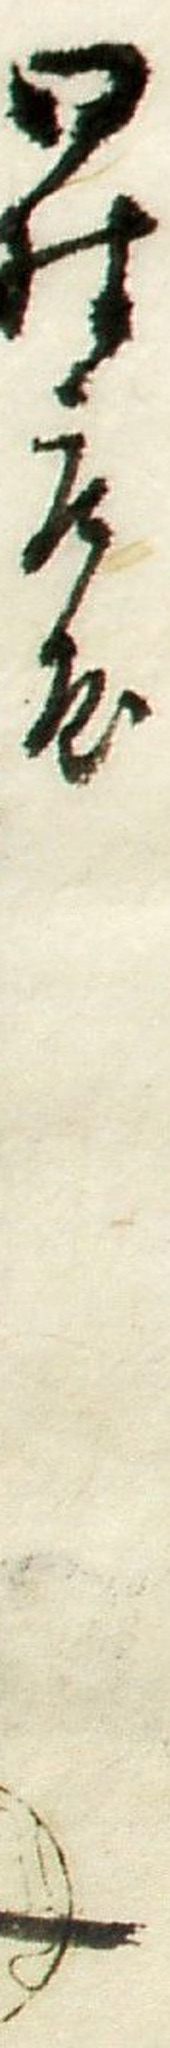同村庄屋

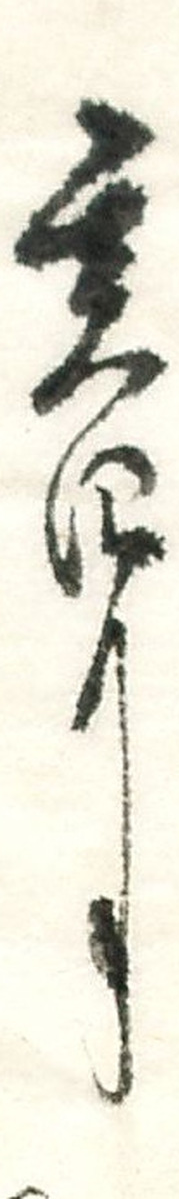亥四月
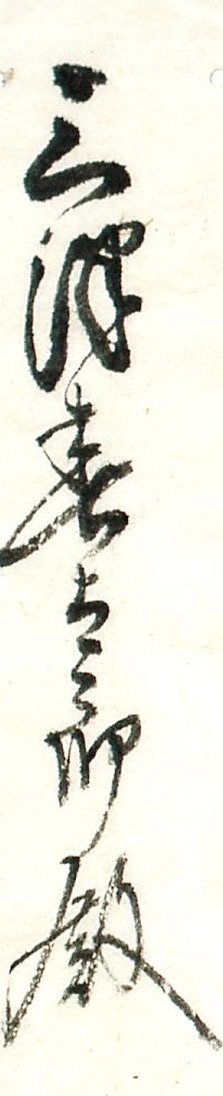三澤春太郎殿
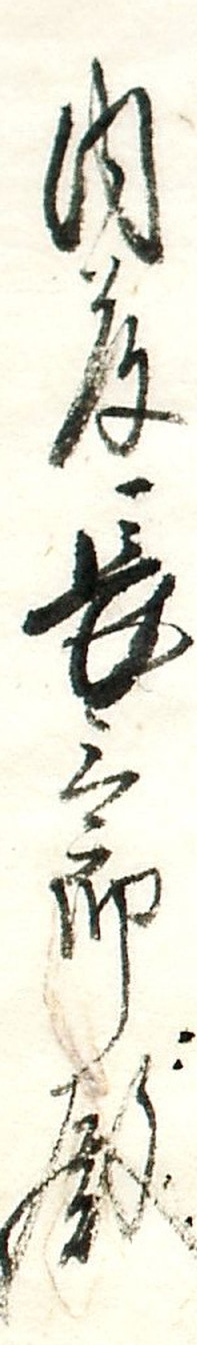内藤長三郎殿
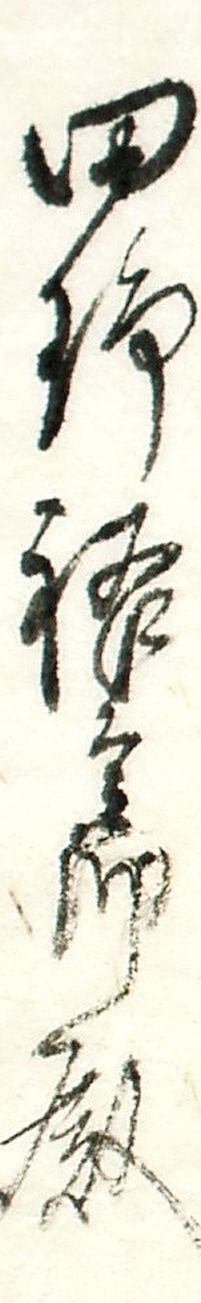田野祐太郎殿
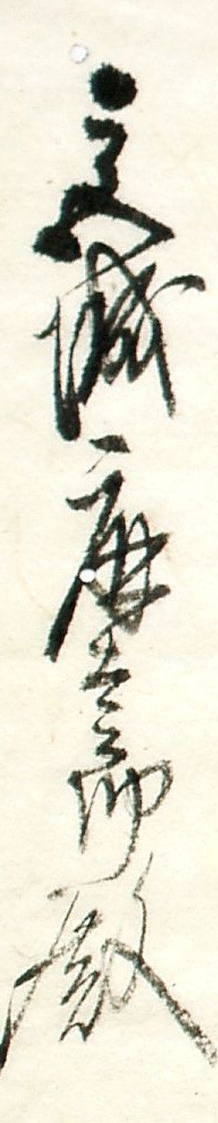宮城麻太郎殿

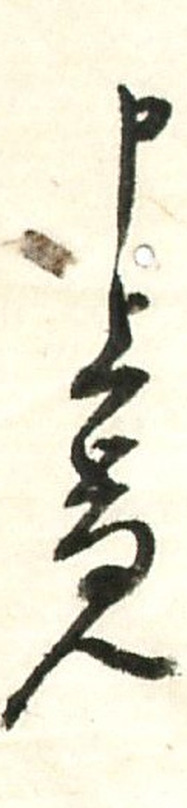申上覚
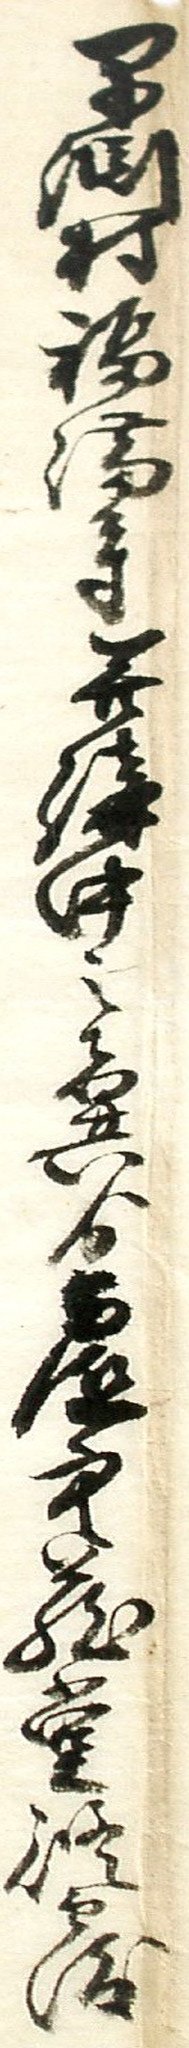早渕村福満寺幷講中之者共ゟ虚空蔵堂修覆
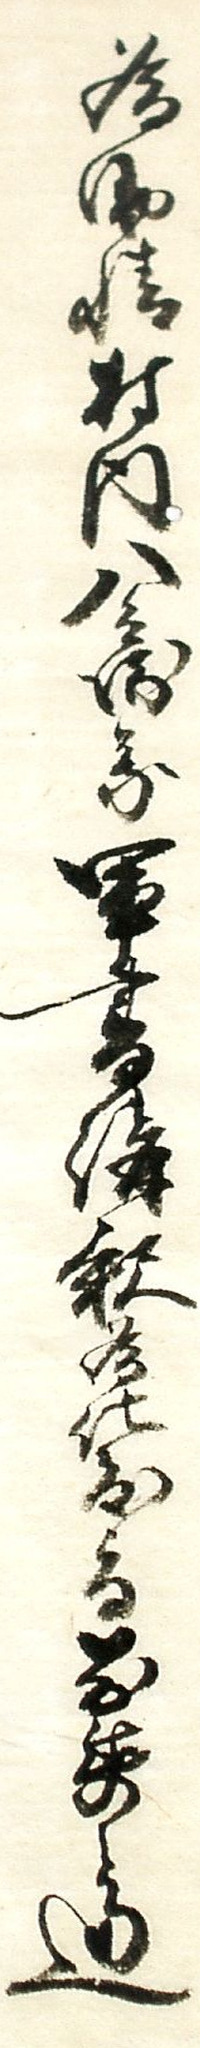為助情村内八兵衛義軍書講釈為仕度旨別帋之通
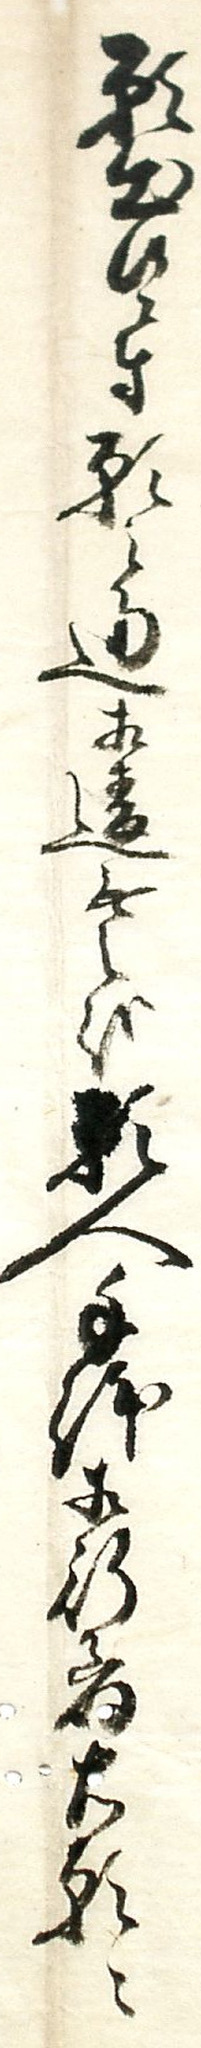願出候ニ付願之通相違無之哉願人手許相行着右願ニ
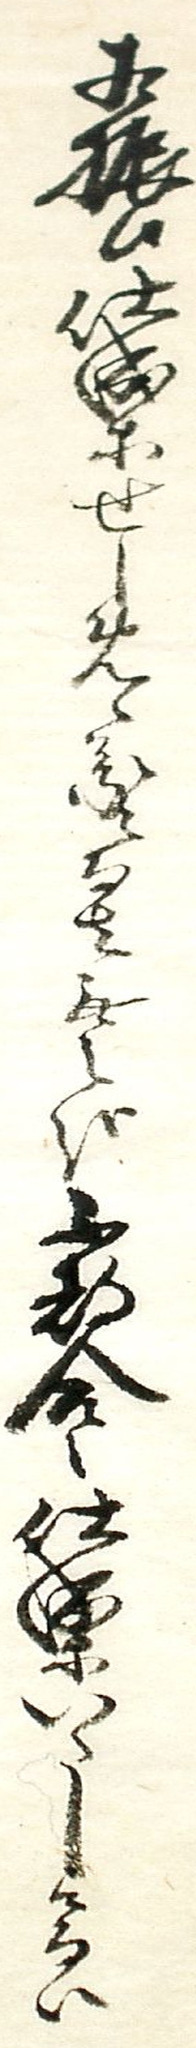相振候仕成等せしめ候義ニ而者無之哉不都合之仕成等いたし候而ハ
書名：(早渕村福満寺子ども浄瑠璃願紙面）他
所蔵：鳴門教育大学 Naruto University of Education
